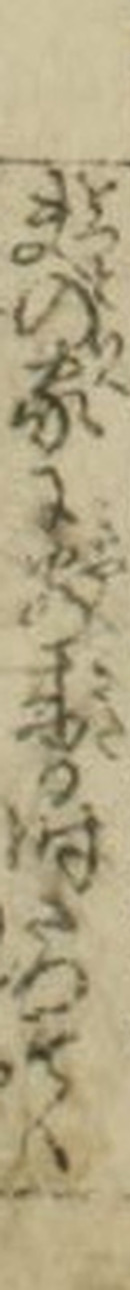夫の家に客来る時さつそく
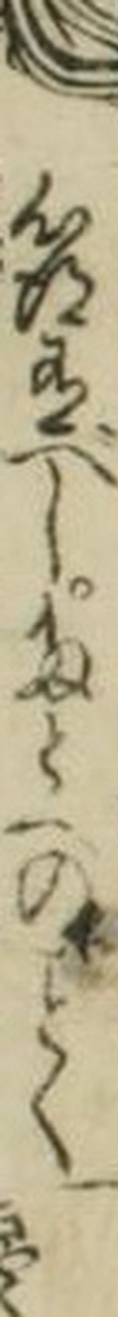心得有べし。たとへのごとく
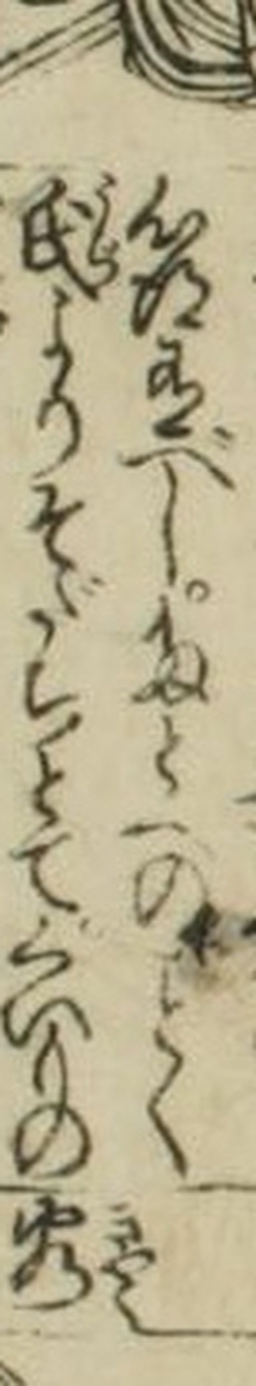氏よりそだちとてくいもの
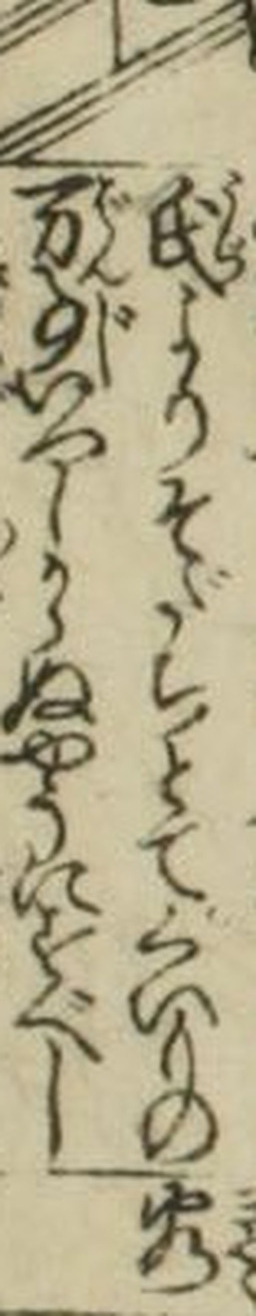万事いやしからぬやうにすべし
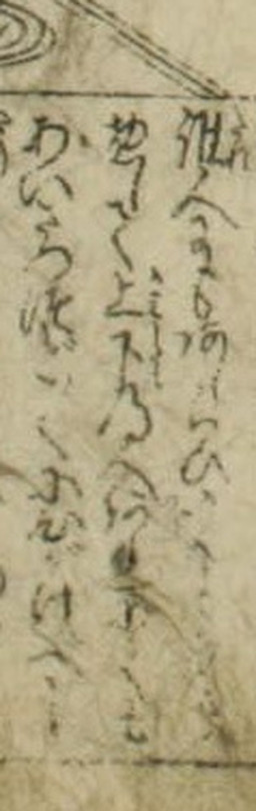惣して上下の人あれも
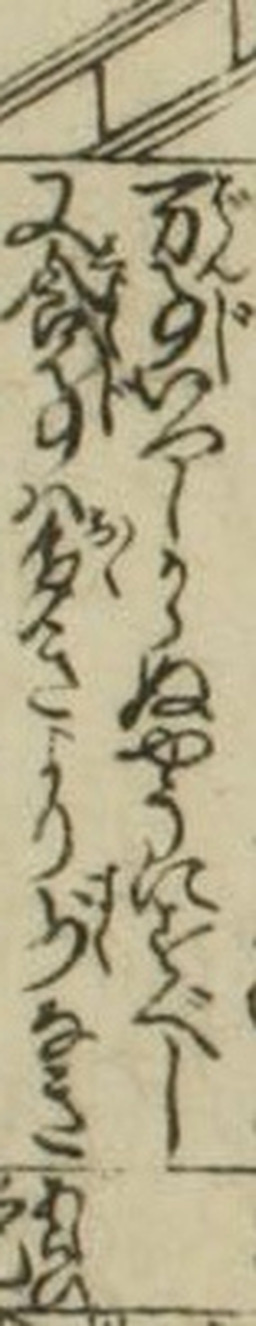又食事は多きより少なき
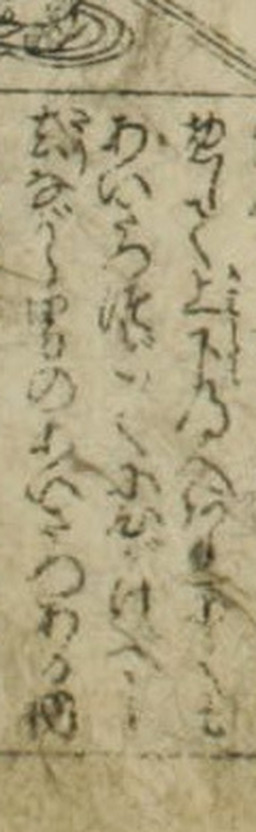あいさつつど〳〵に心がけべし
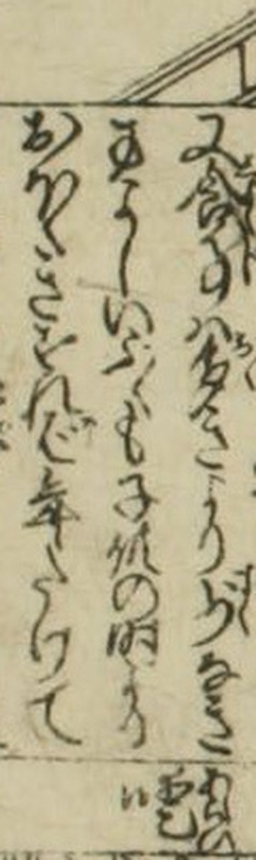事よしいふくも子供の時より
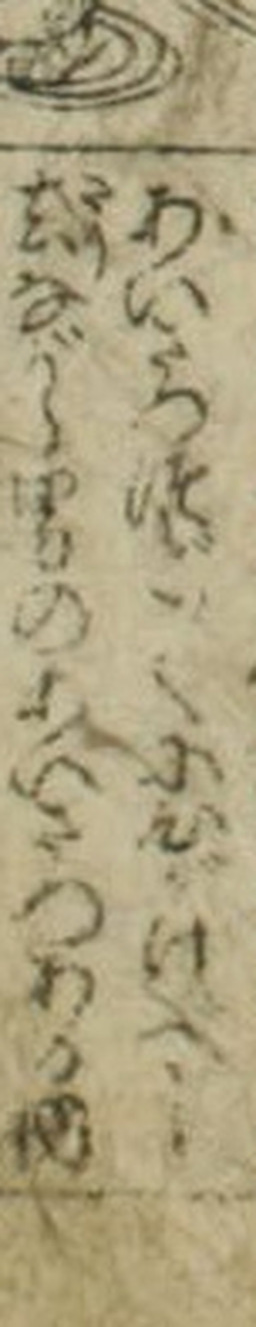去ながら男のあいさつある内
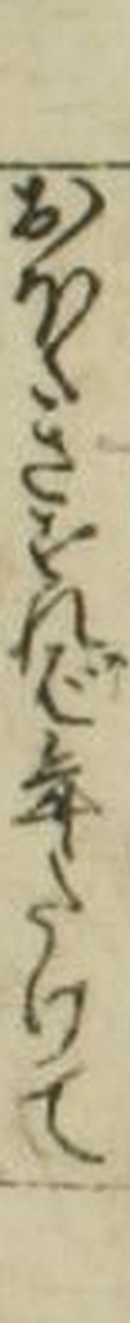おほくきすれば年たけて
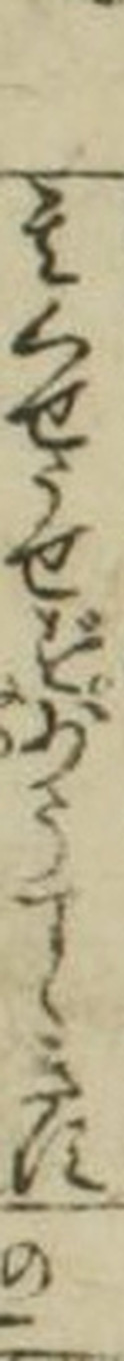其くせうせず。少うすくきす
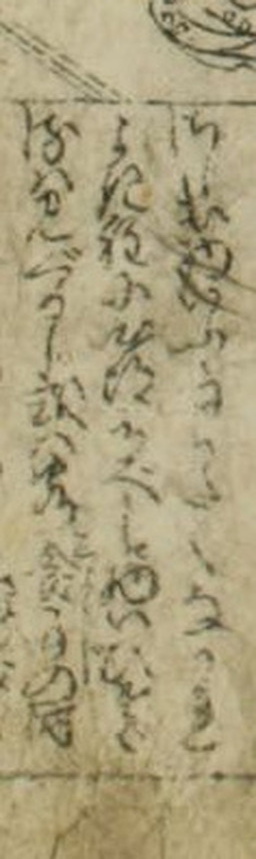よき程に心得るべし物いひすぐ
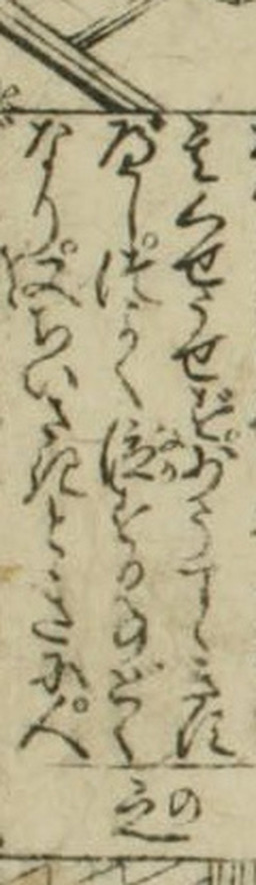べし。つよく泣する事どく
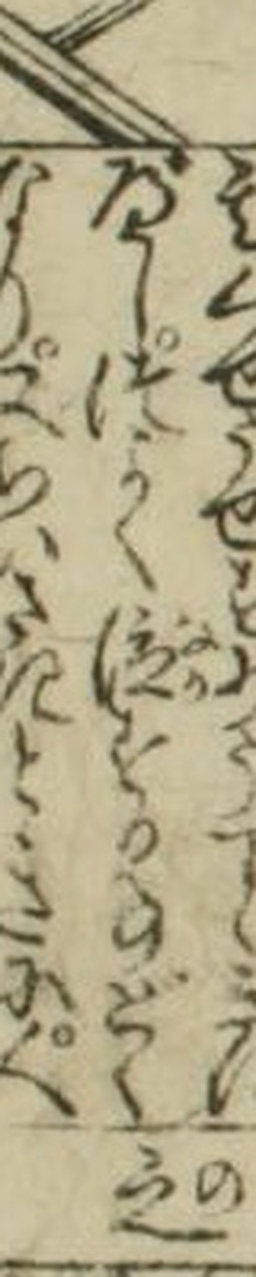なり。又ちいさきときに。人
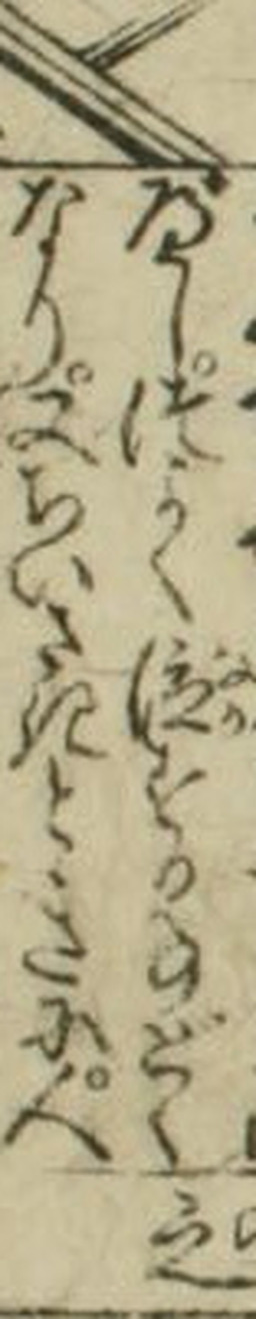なり。又ちいさきときに。人
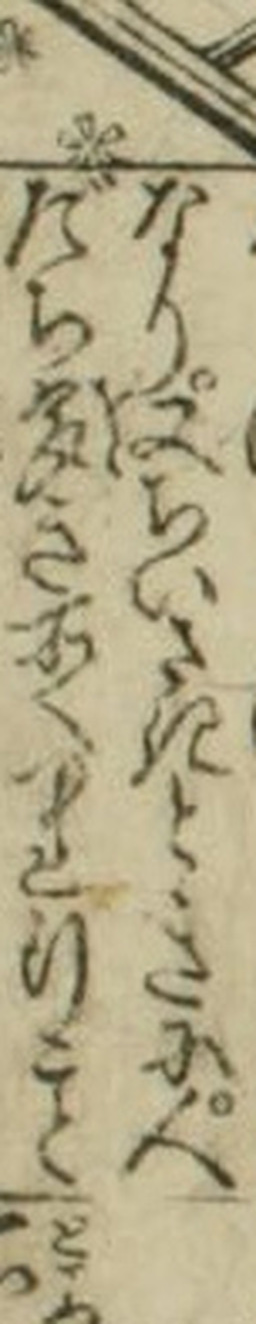だち多き所へつれ行こと
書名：女源氏教訓鑑
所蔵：東京学芸大学附属図書館
